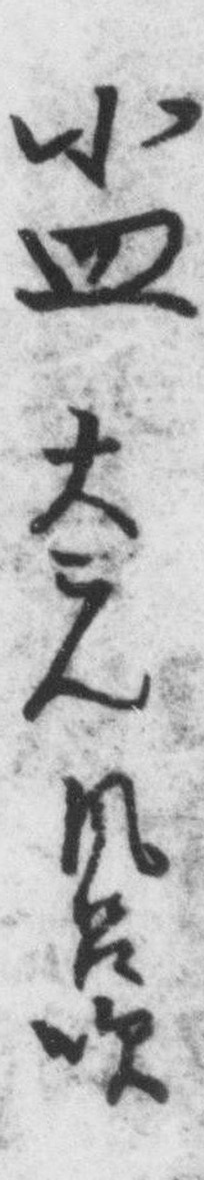小皿大こん風呂吹
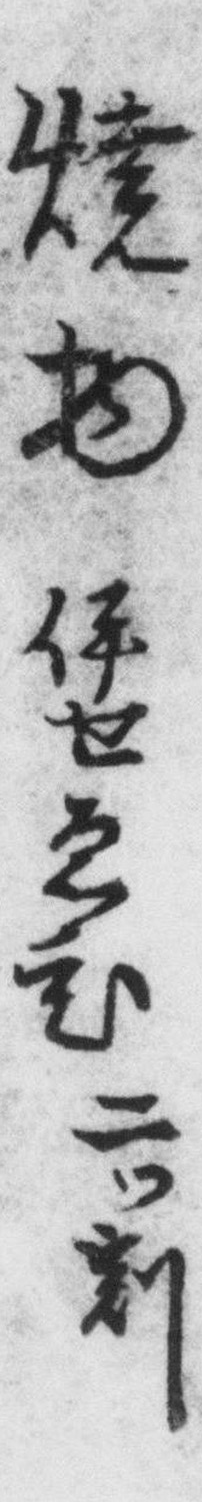焼物いせゑひ二つ割
